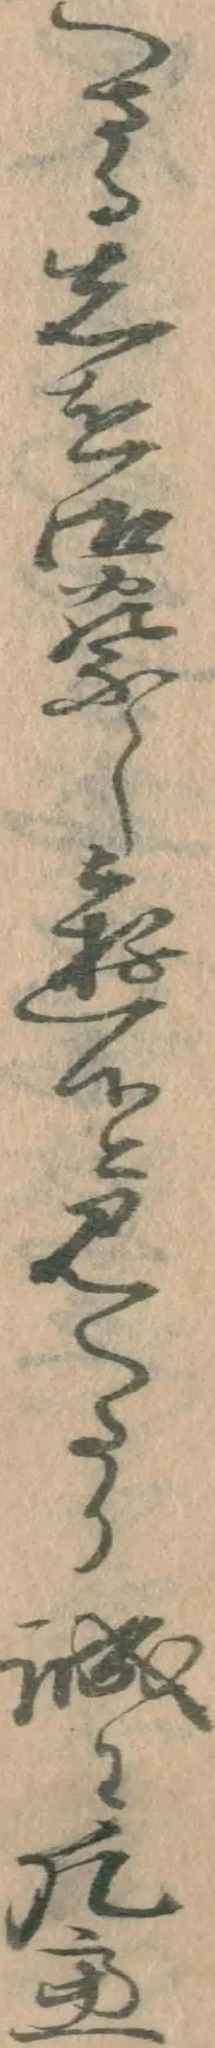へさる先を御察し被遊候と見へたり誠に凡慮
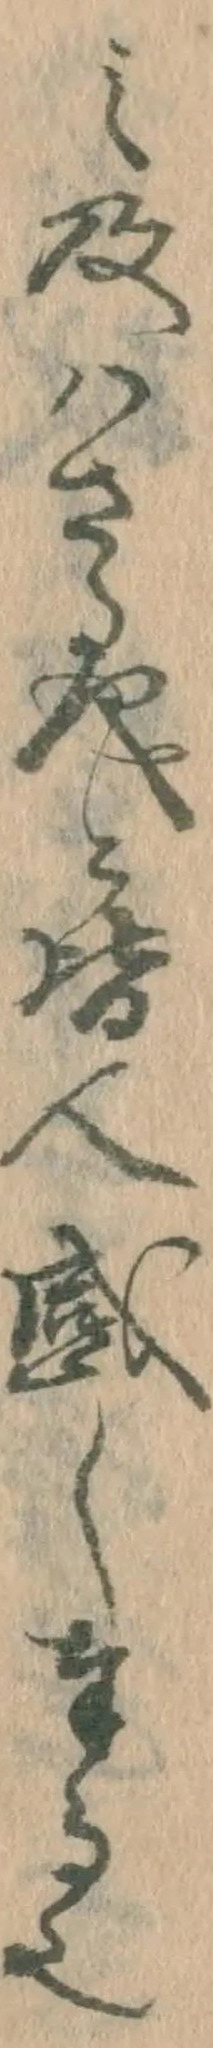之及はさる儀と皆人感し奉る也
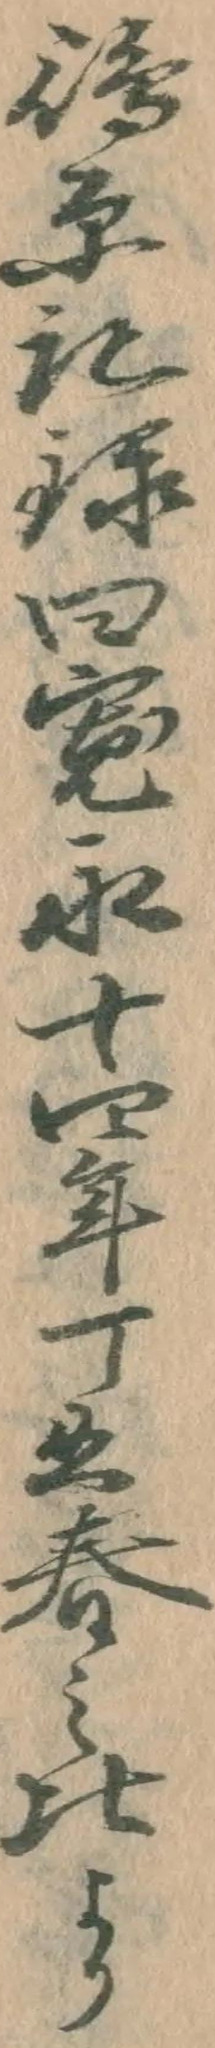島原記録曰寛永十四年丁丑春之比より
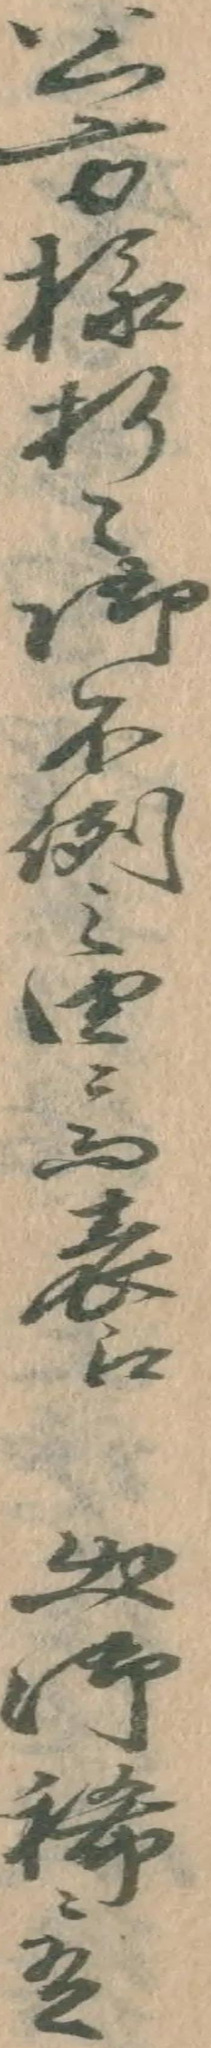公方様折々御不例之由に而表え出御稀に有
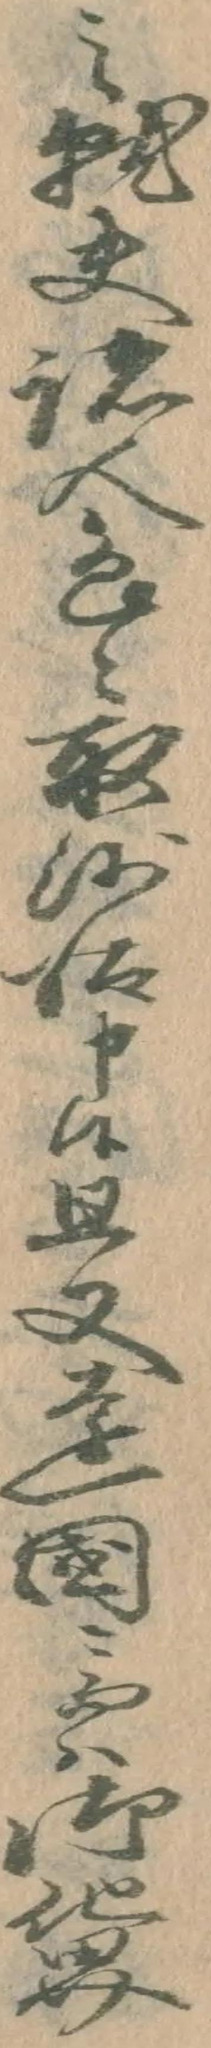之就夫諸人色々取沙汰申候且又遠国に而は御他界
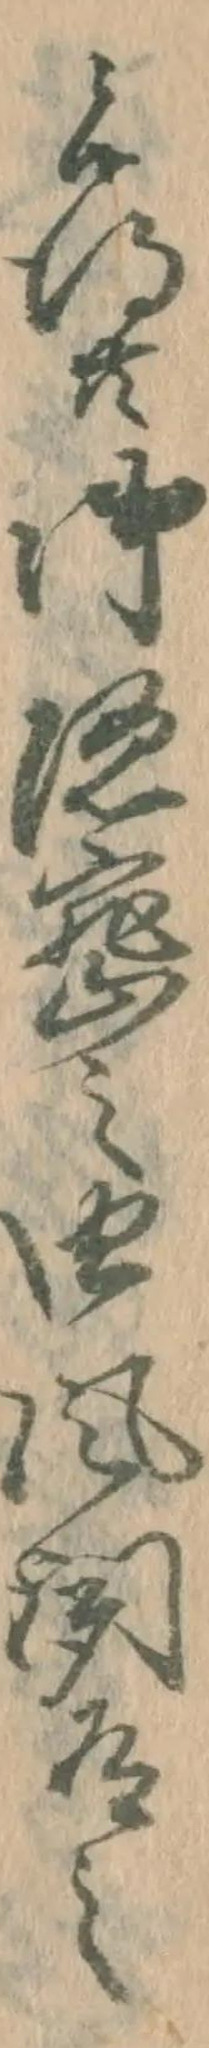に候得共御隠密之由風聞有之
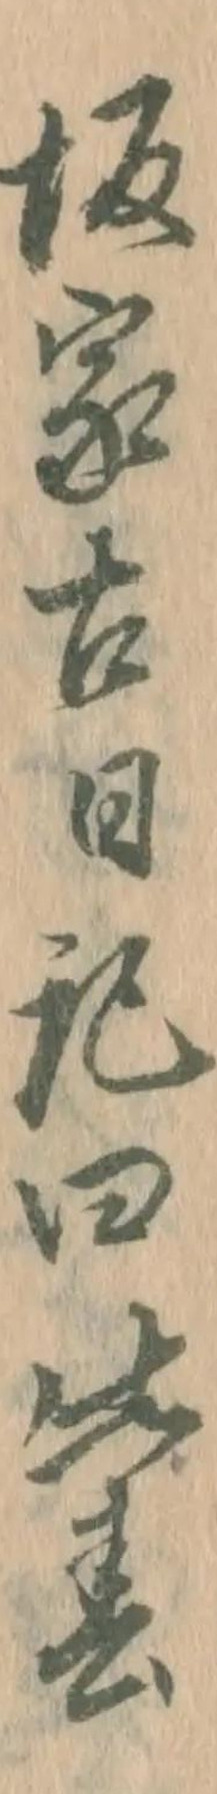坂家古日記曰此
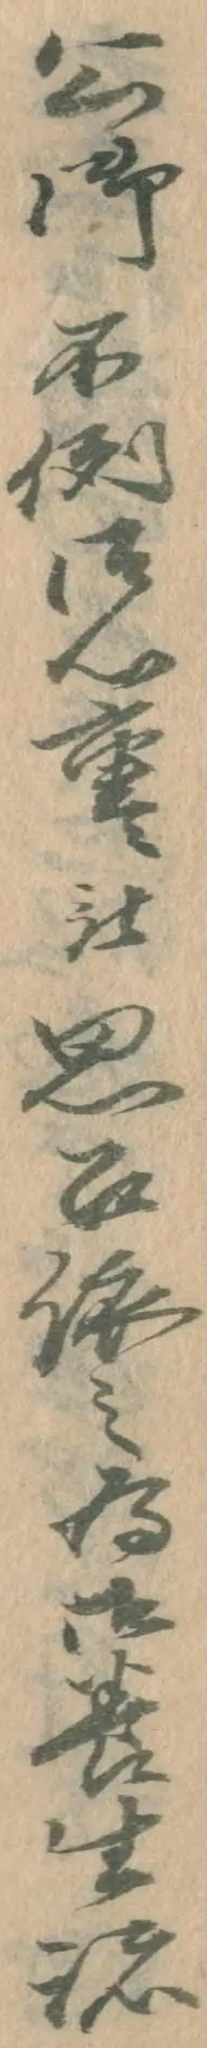公御不例御心重に被思召依之為御養生諸

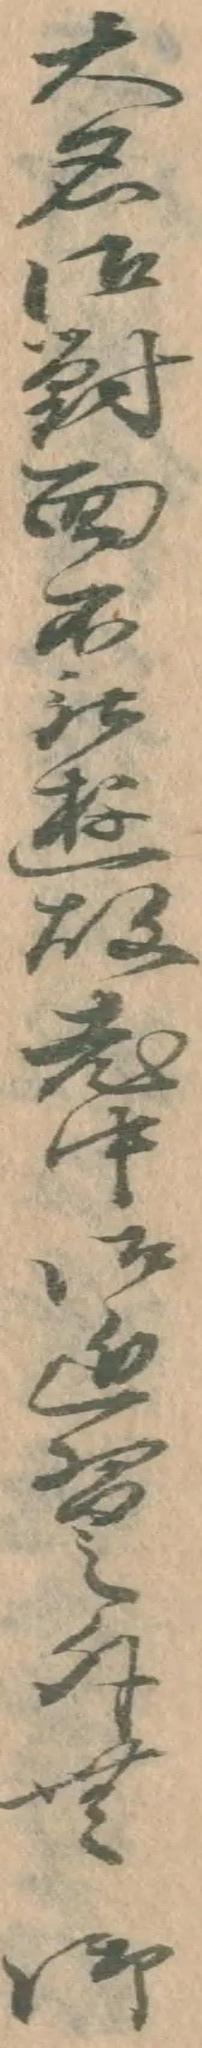大名御対面不被遊故老中御近習之外無御
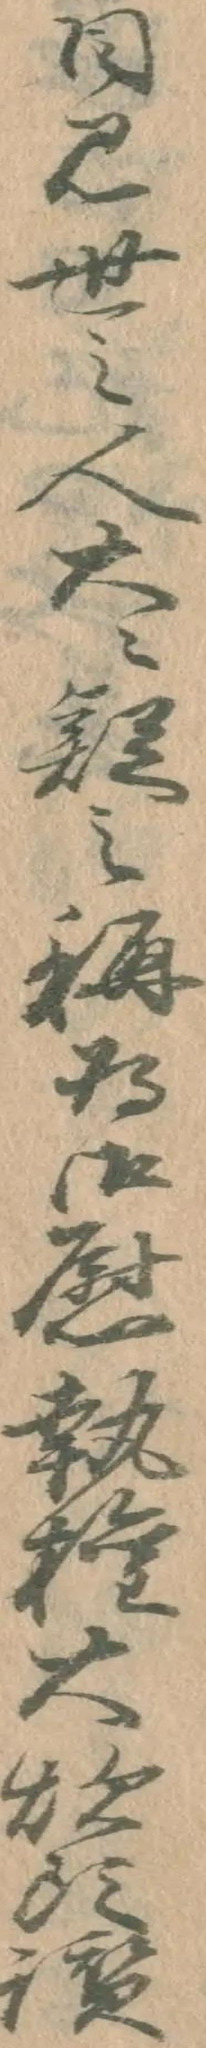目見世之人大に難之称為御慰執権大炊頭讃
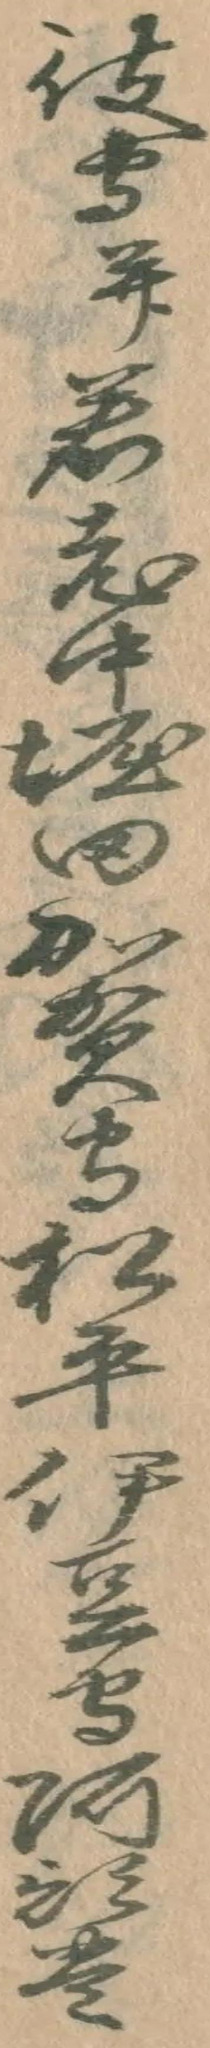岐守并若老中堀田加賀守松平伊豆守阿部豊
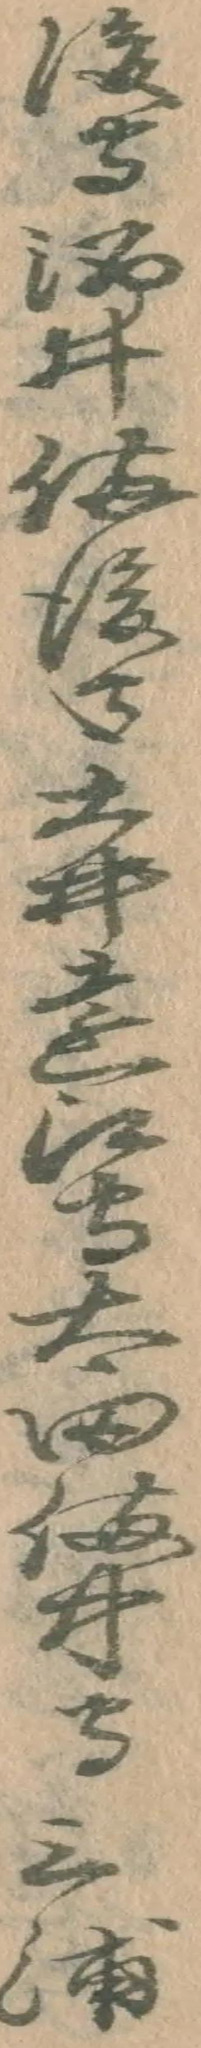後守酒井備後守土井遠江守太田備中守三浦
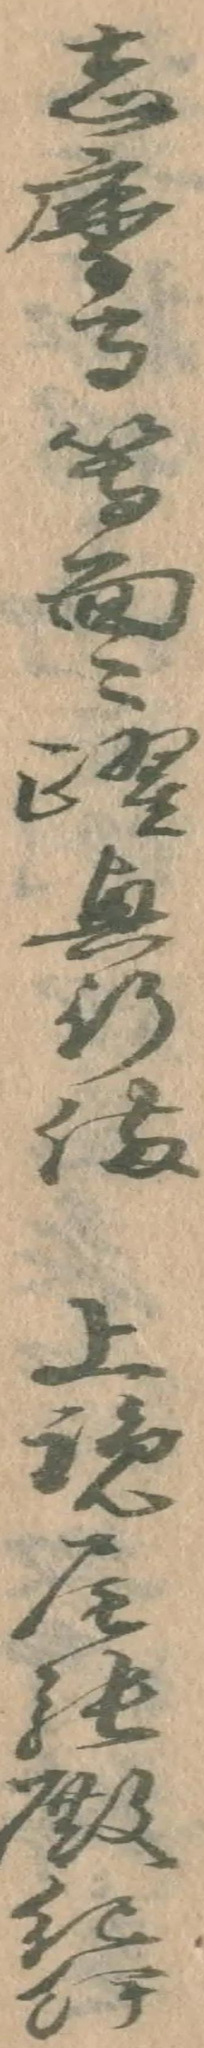志摩守等面々躍興行備上覧尾張殿紀伊ヵ
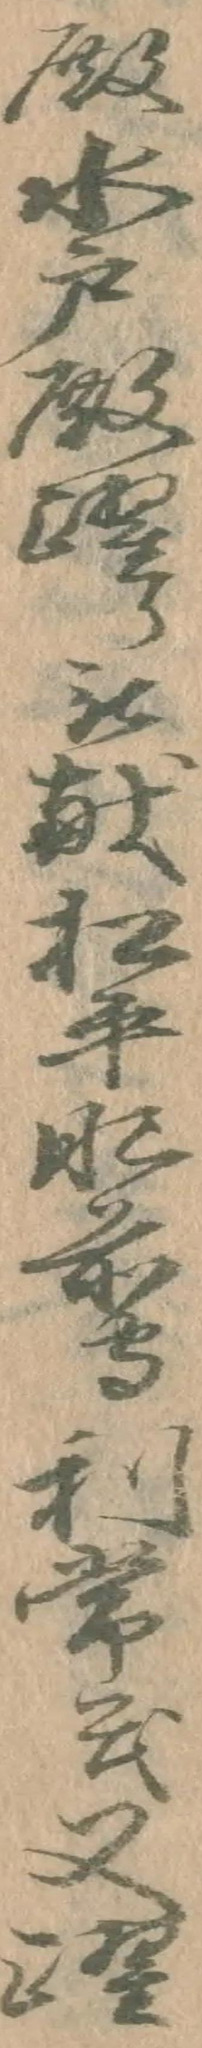殿水戸殿躍り被献松平肥前守利常も又躍
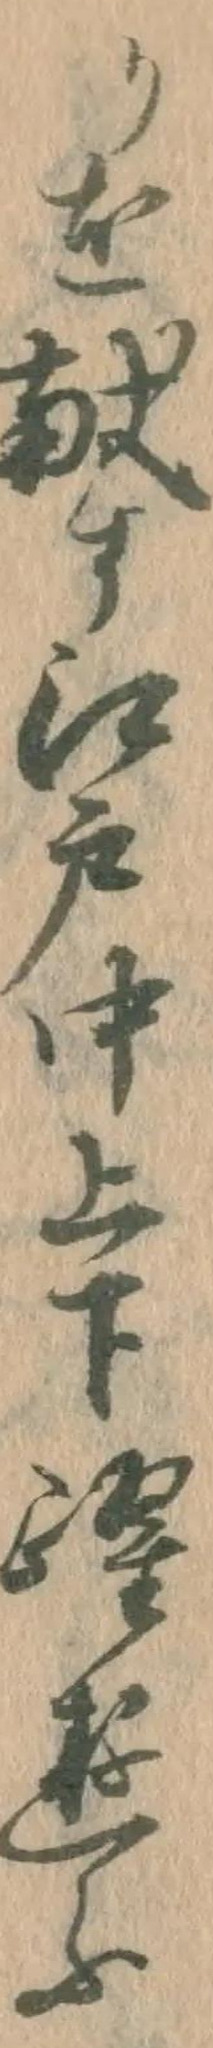りを献す江戸中上下躍遊ふ
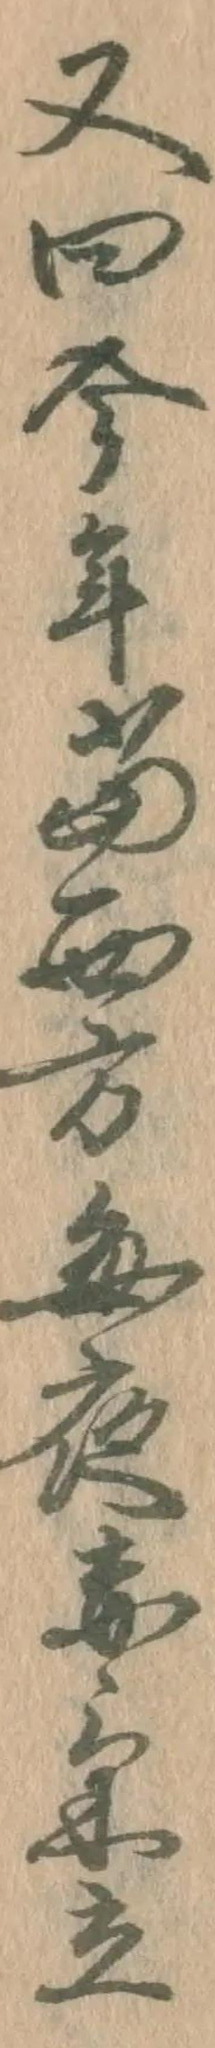又日今年当西方毎夜赤気立
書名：切支丹御退治記 49巻. [1]
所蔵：国立国会図書館 National Diet Library, JAPAN
